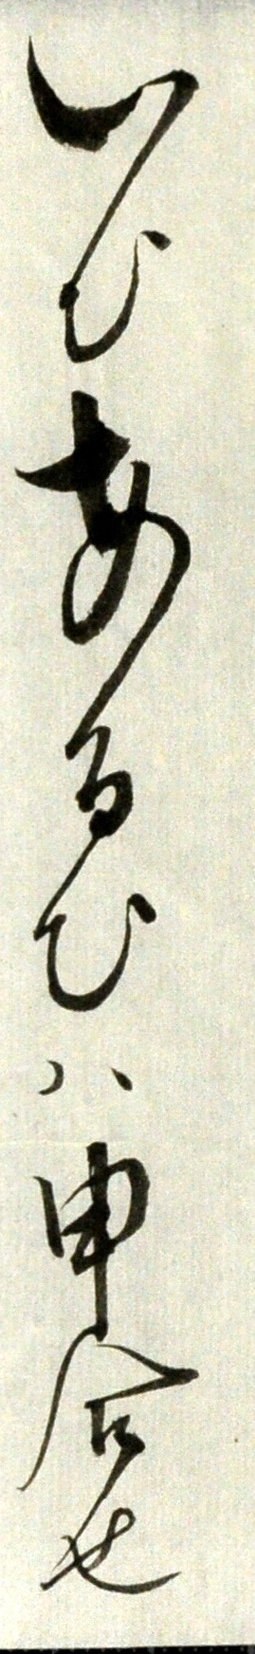いひあるひハ申合せ
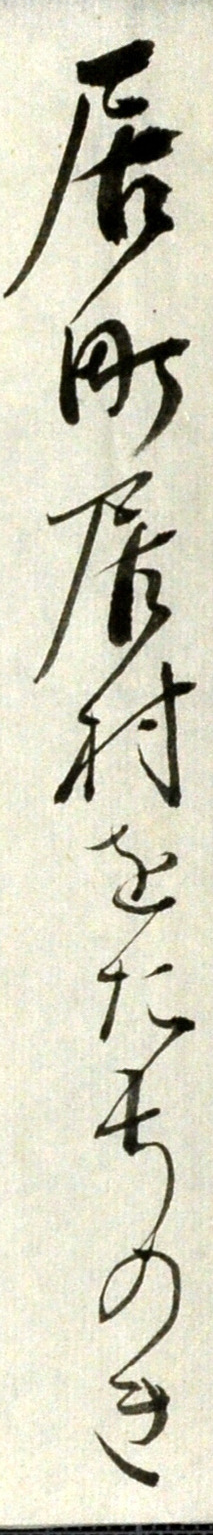居町居村をたちのき
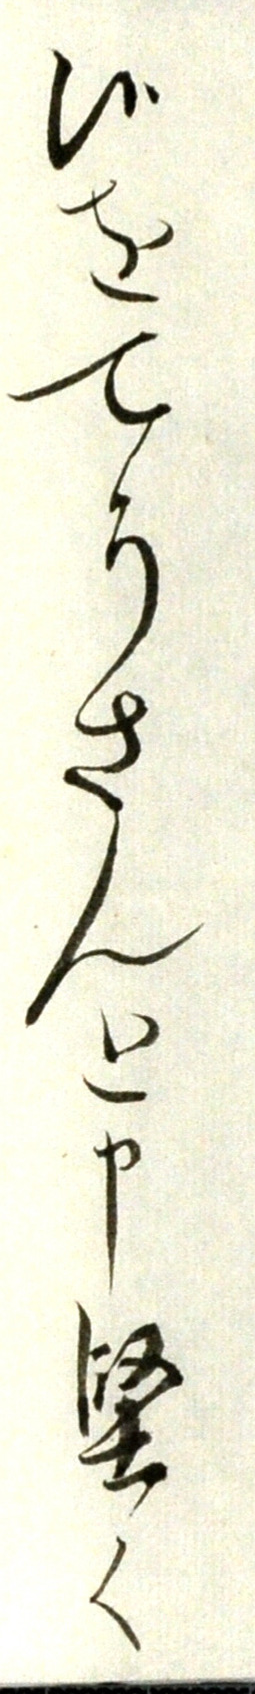候をてうさんと申堅く
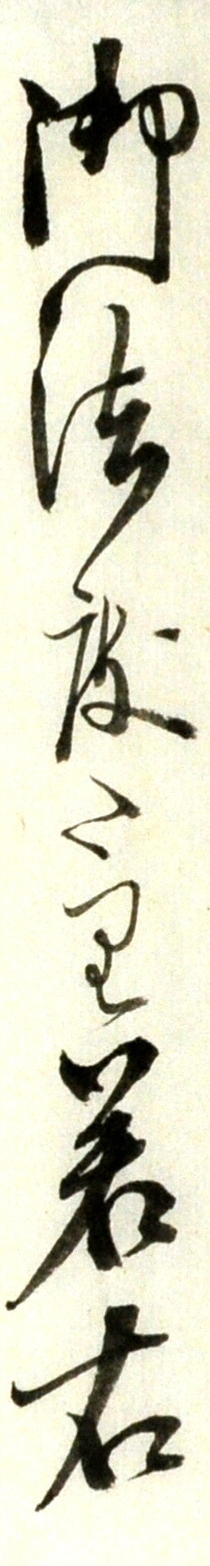御法度たり若右
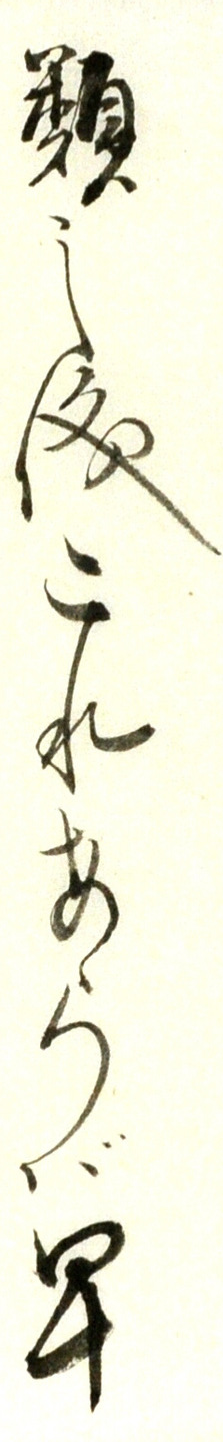類之儀これあらバ早
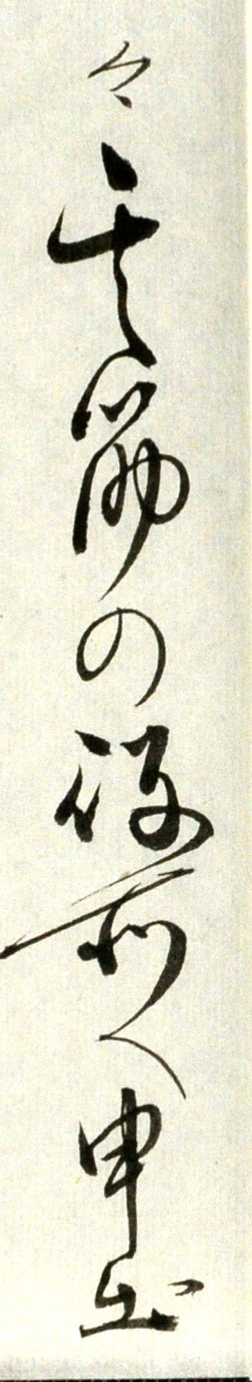々其筋の役所へ申出
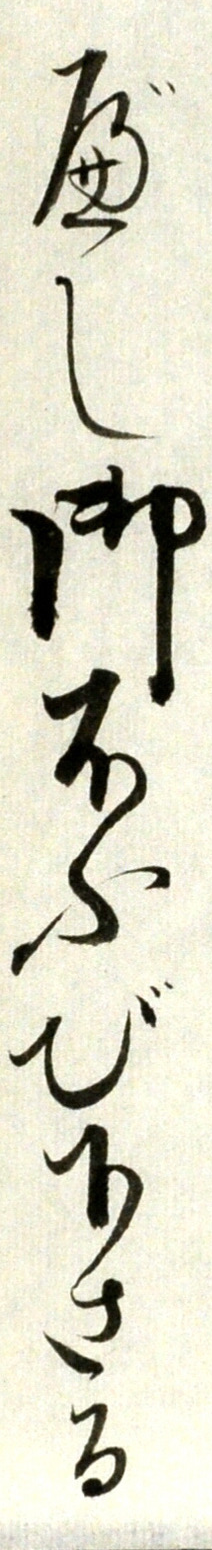べし御ほふび下さる
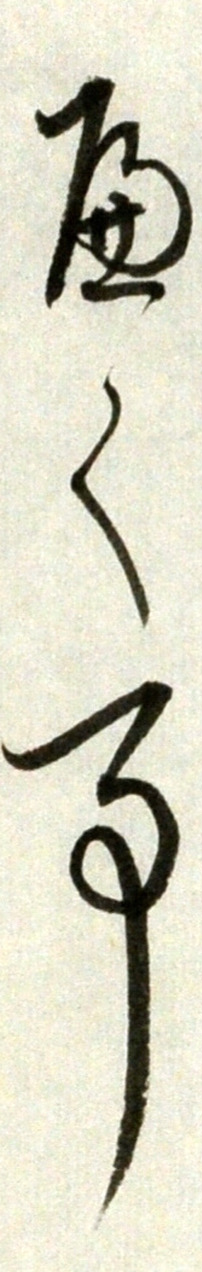べく事
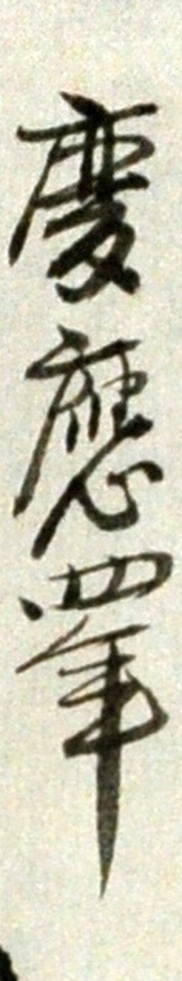慶應四年
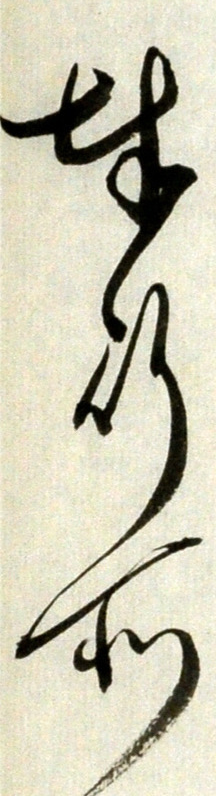奉行所

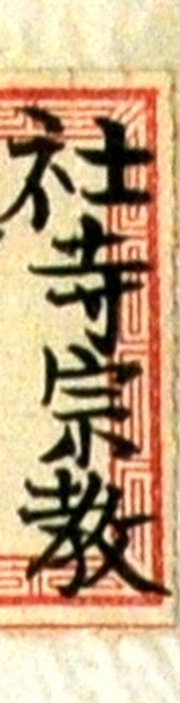社寺宗教
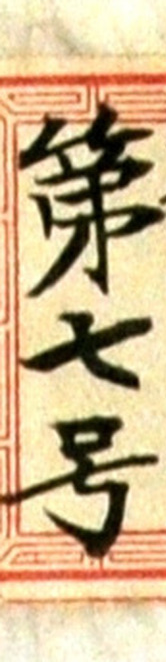第七号
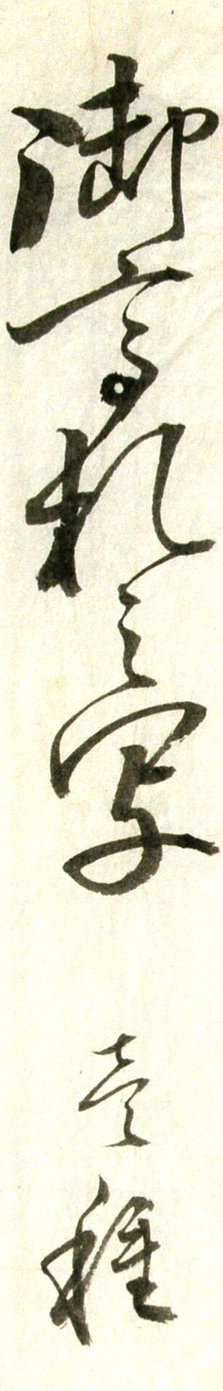御高札之写壱種

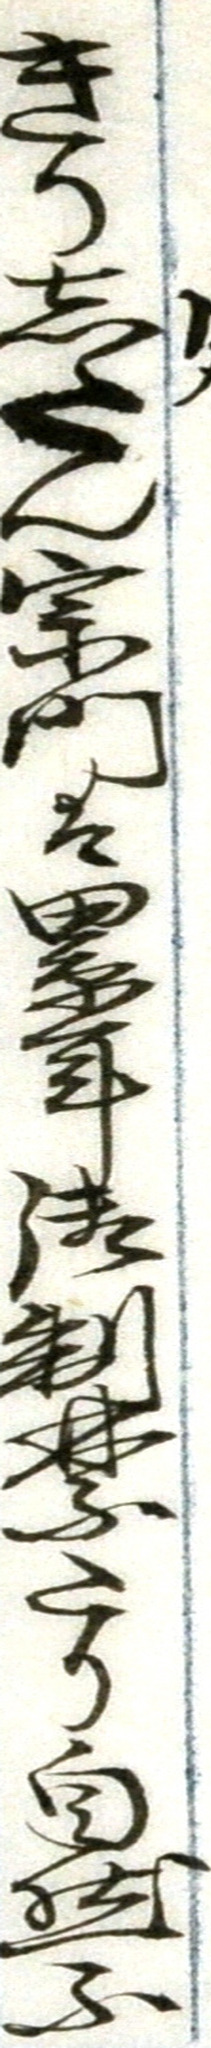きりしたん宗門は塁年御制禁たり自然不
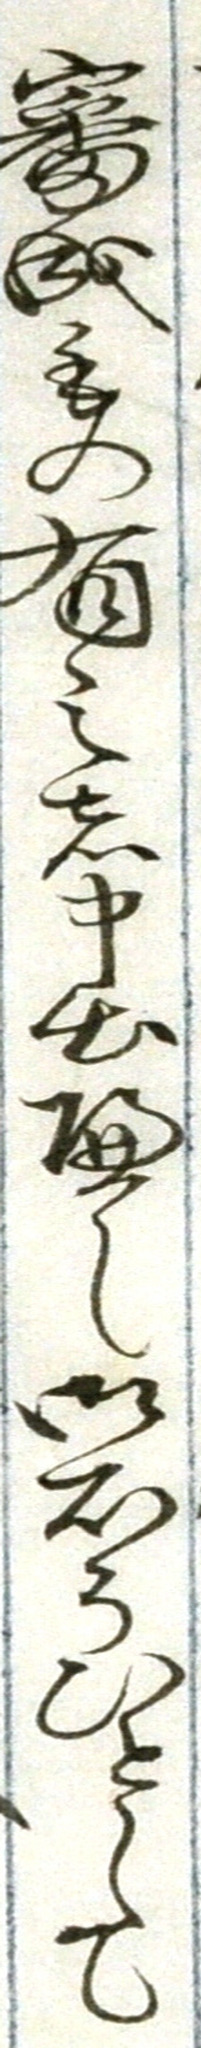審成もの有之者申出べし御ほうびとして
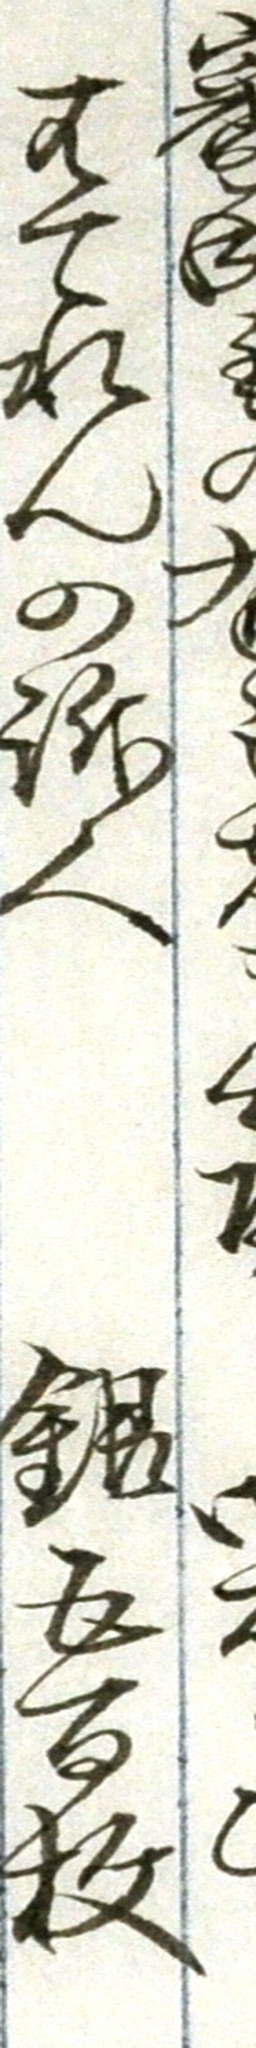ばてれんの訴人銀五百枚
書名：御高札之写
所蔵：伊那市立高遠町図書館・合同会社AMANE
